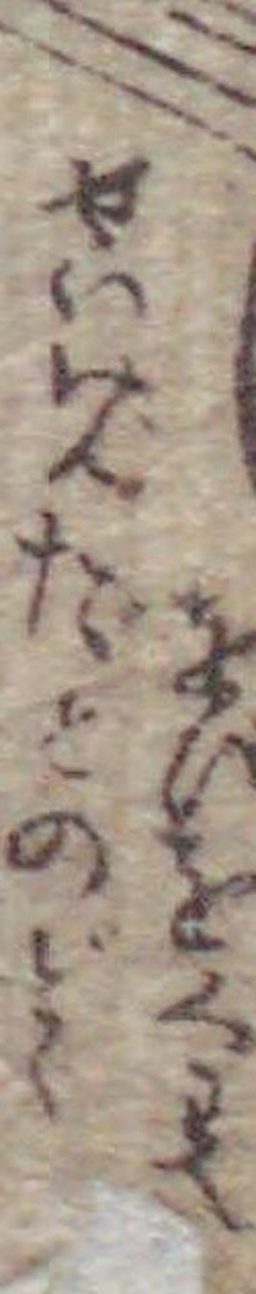せいけんたとのどく
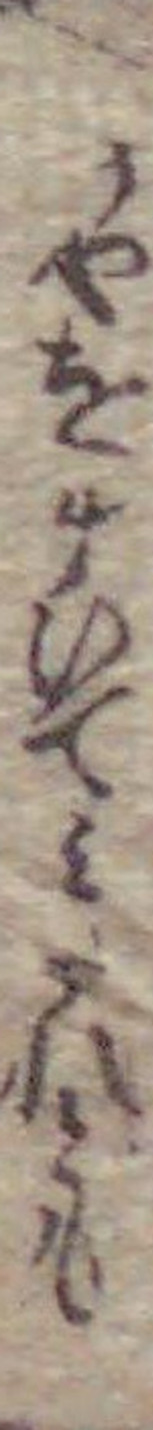かやをまいてみたれとも
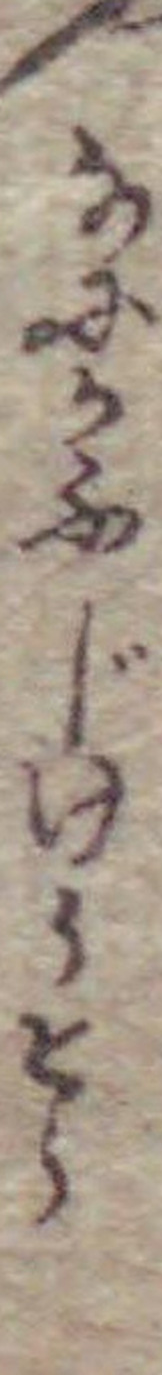なにかふじゆうとら
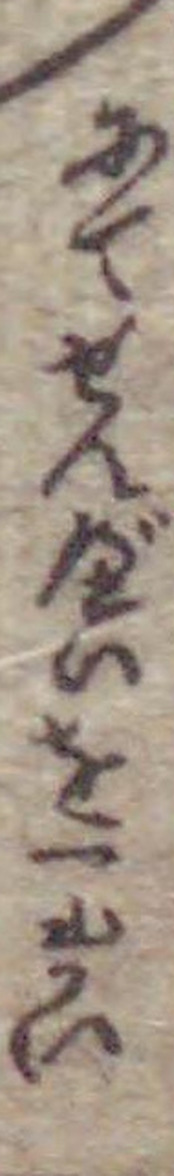にてせんべいを一まい
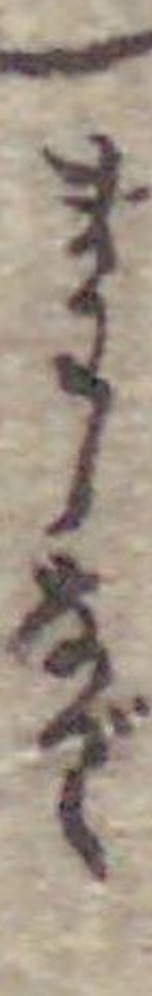まわしながら
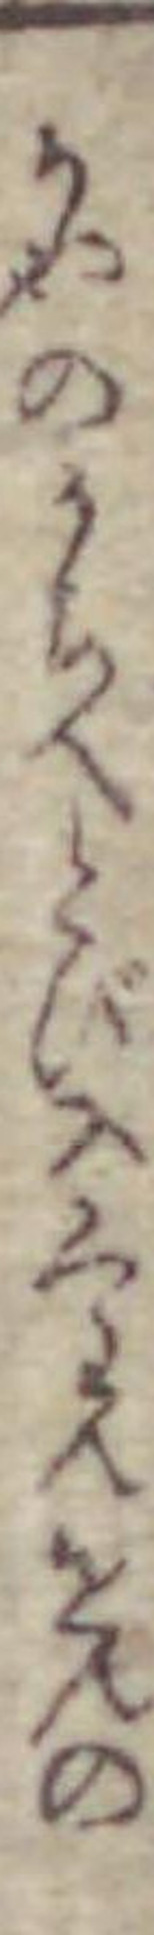かやのうちへとび入くわんをんの
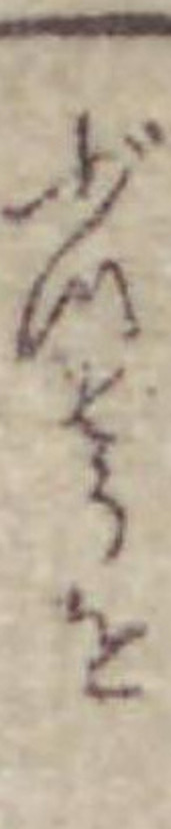ぶつそうを
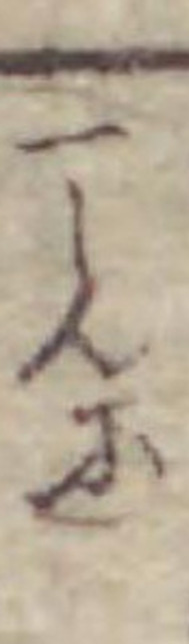一しんに
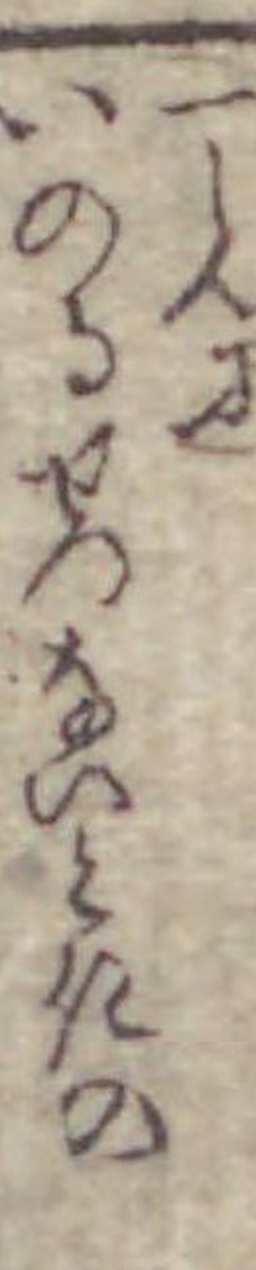いのるせつないときの
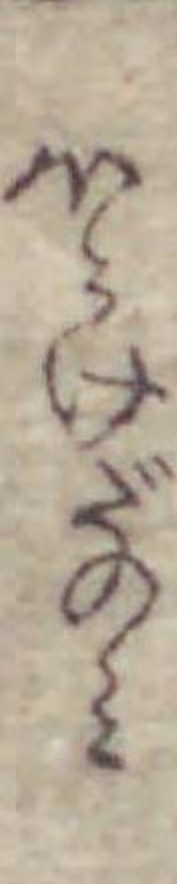ほとけだのみ
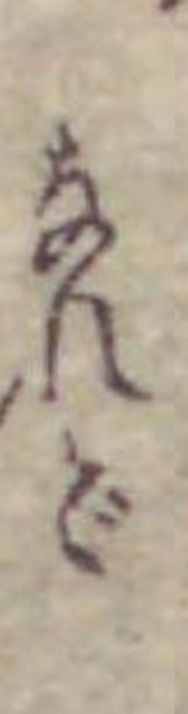なれど
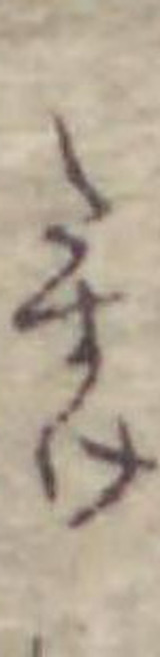たすけ
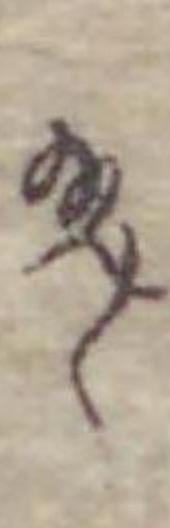給へ〳〵

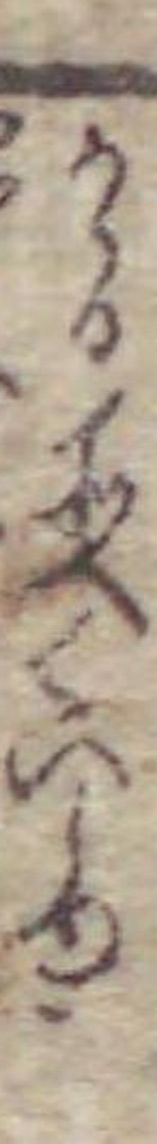かゝる所へていしゆ
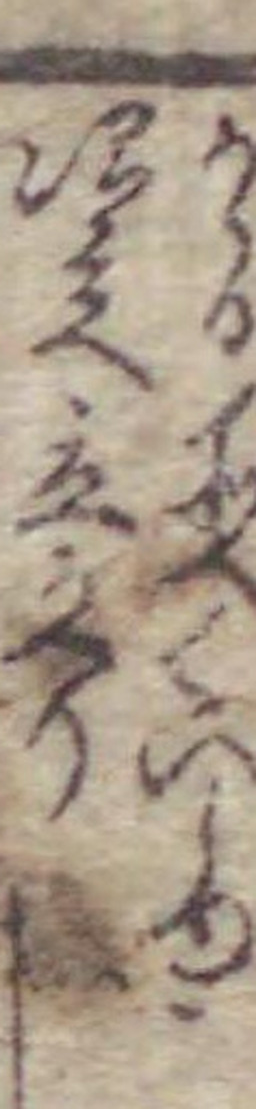治兵衛立かへり
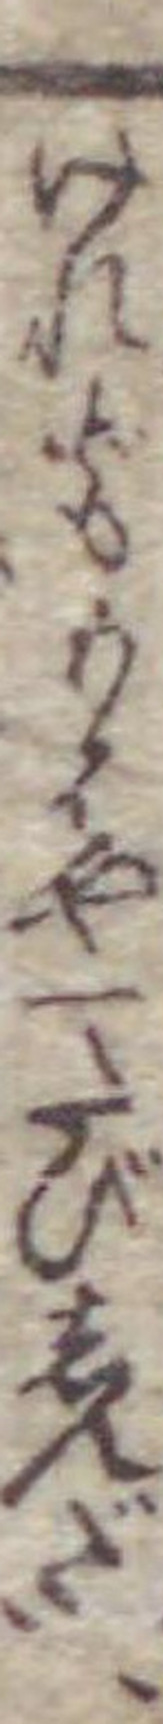けれどももはや一たびしんだ
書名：嗚呼不侭世之助噺 : 3巻
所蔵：国立国会図書館 National Diet Library, JAPAN
